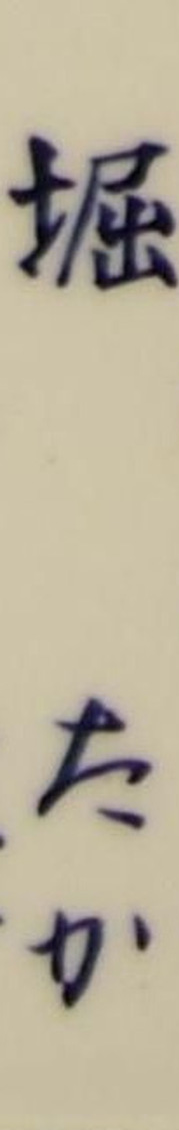堀たか
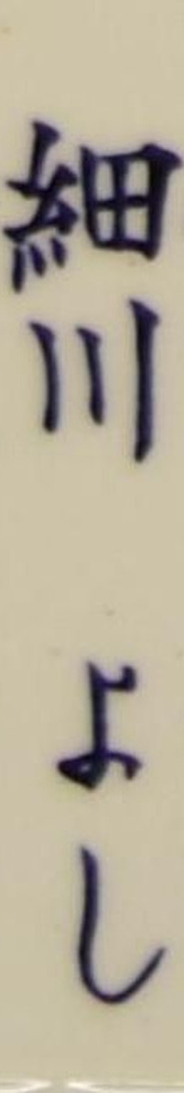細川よし
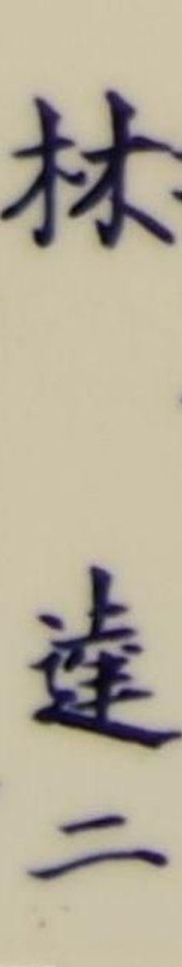林達二
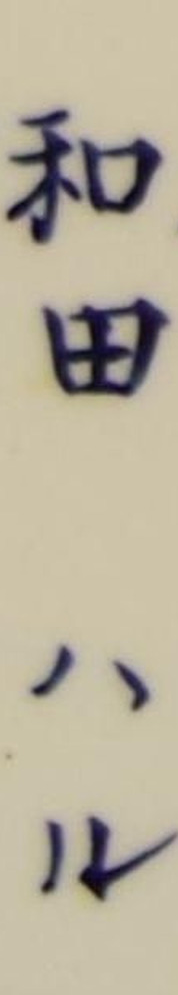和田ハル
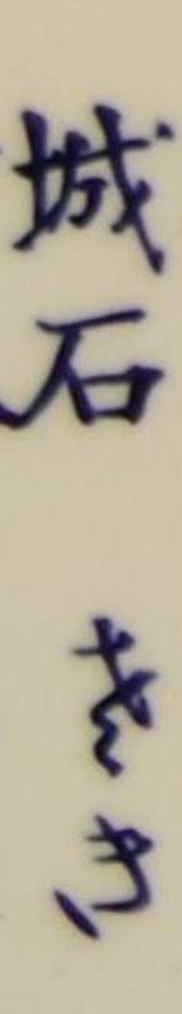城石さき
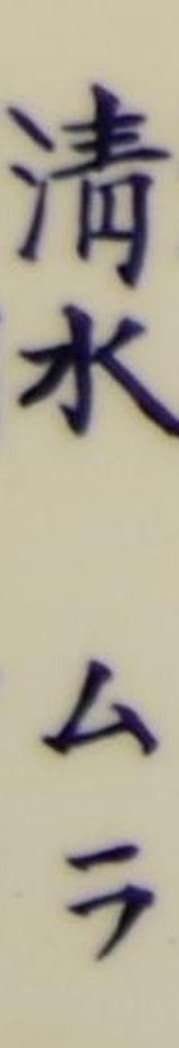清水ムラ
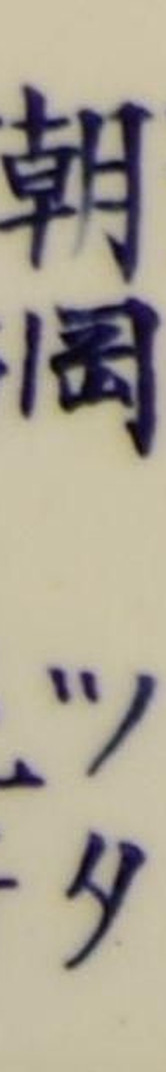朝岡ツタ

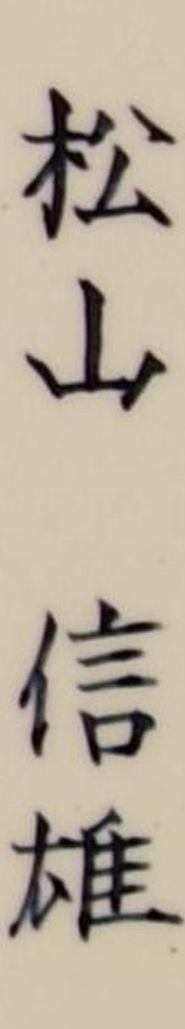松山信雄
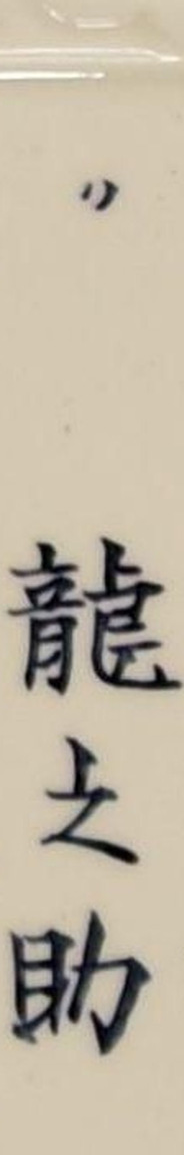龍之助
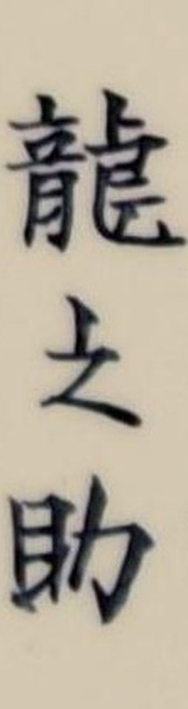龍之助
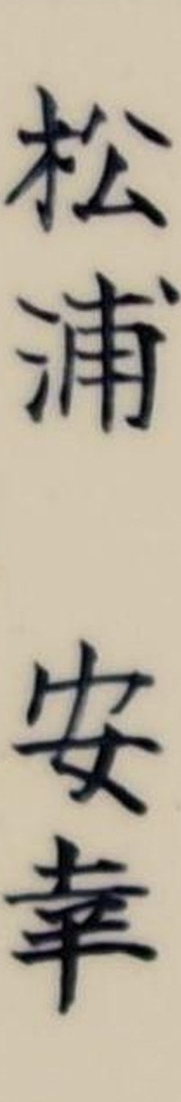松浦安幸
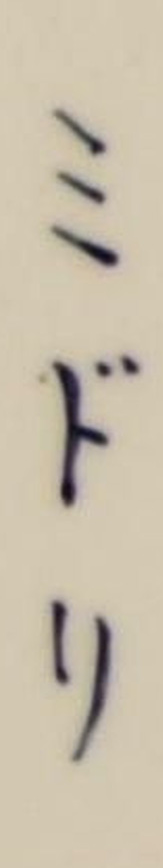ミドリ
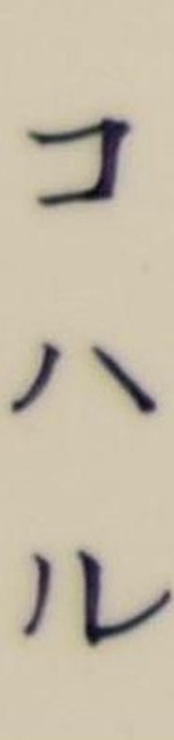コハル

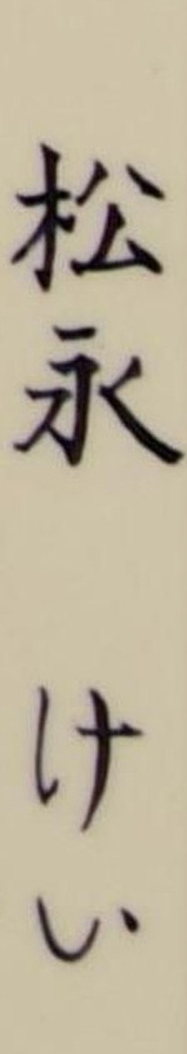松永けい
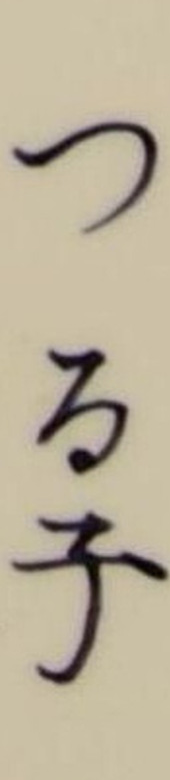つる子
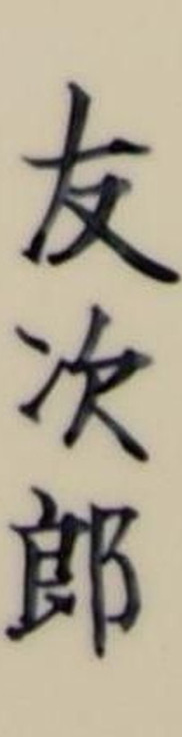友次郎
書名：A~D
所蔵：koyasan kongobuji
